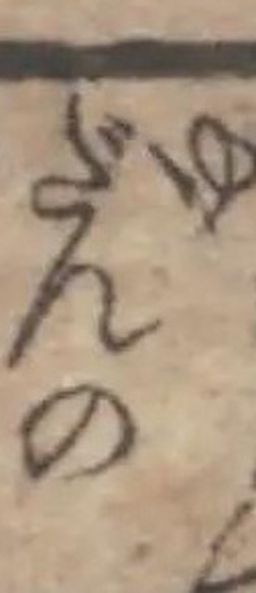だんの
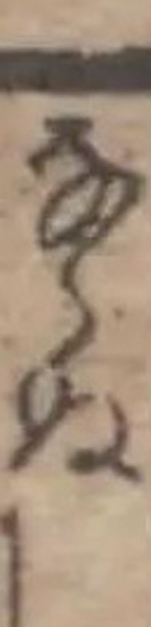ならぬ
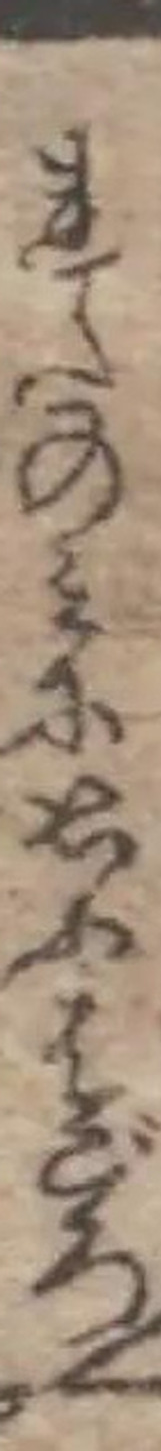れたのミに思ふはごろ
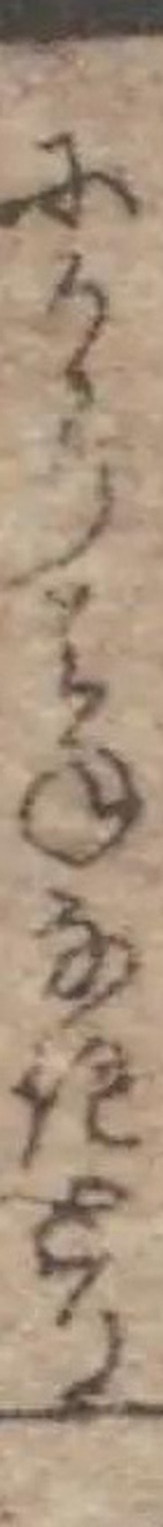にかゝりはねなきとり
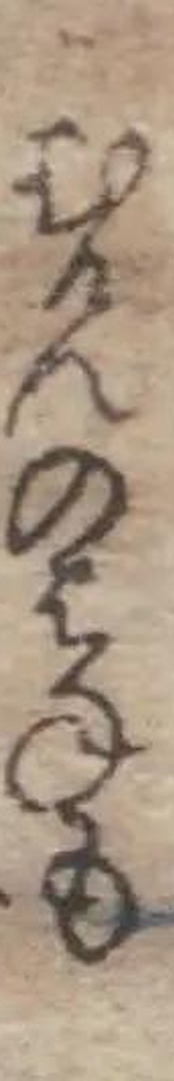むけんのはねも
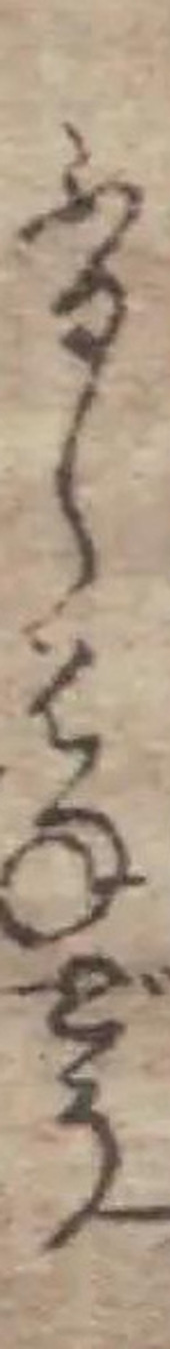ふるしはねどう
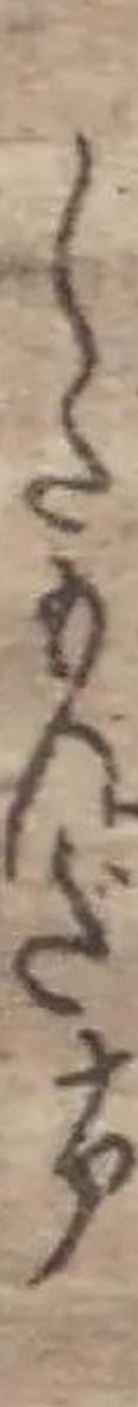したもんだナア

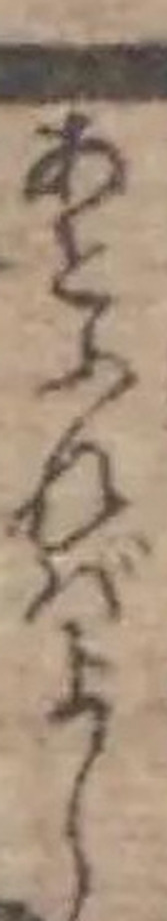あたふれバよし
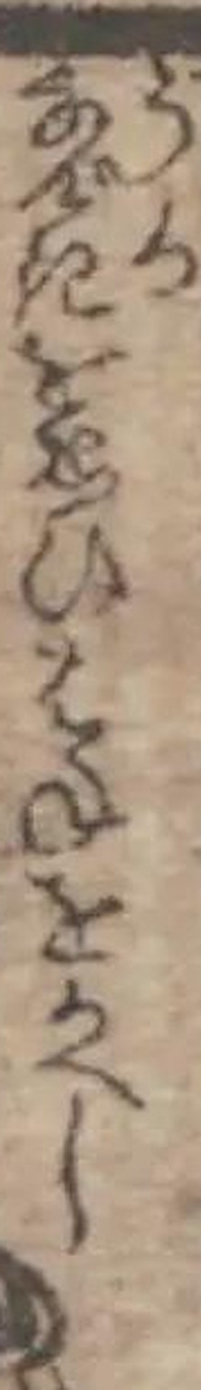なげきを思ひはねをかへし
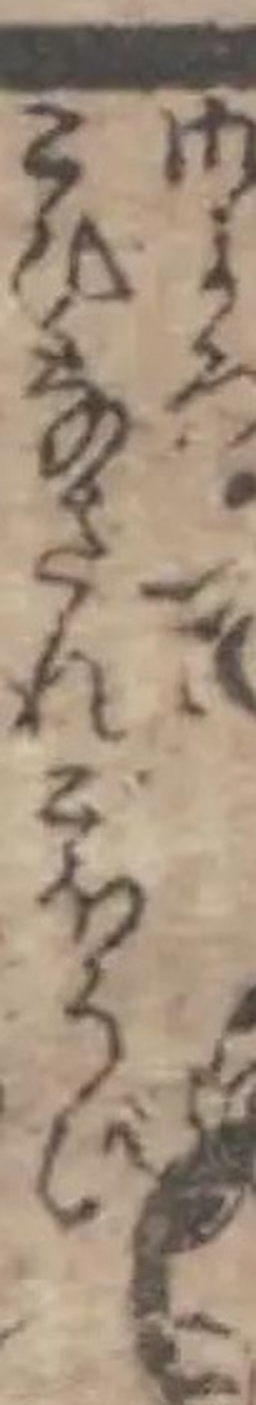こひなされごほうび
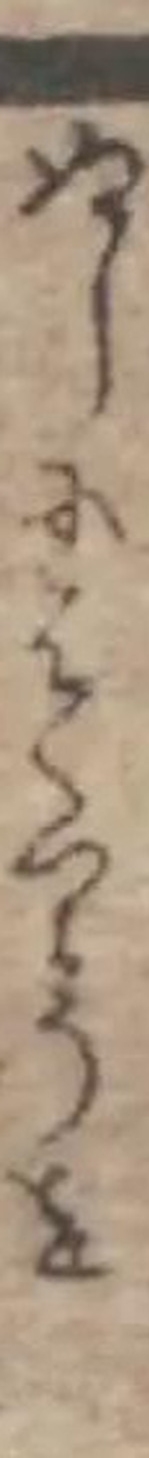ぬしにはくりうを
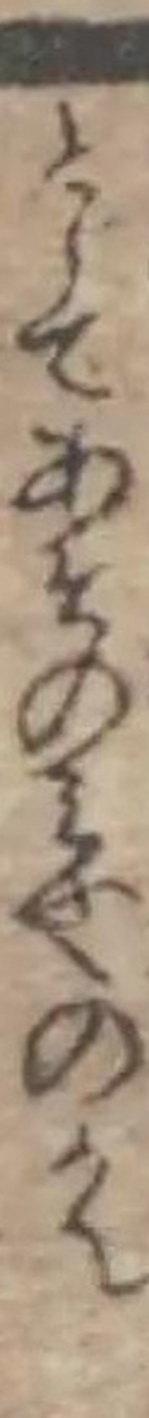としてあそのミやのかん
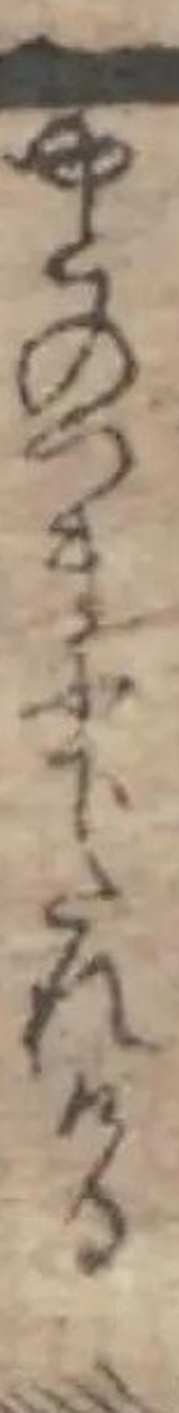やとのつまに下されける
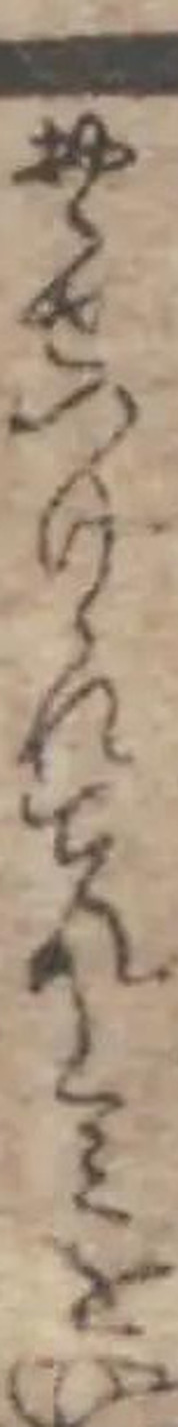おゝせつけっれてんとミを
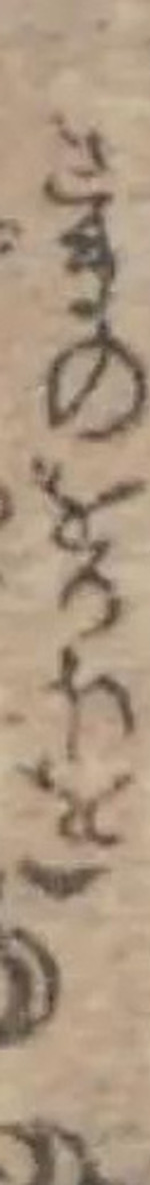さまのおかほを
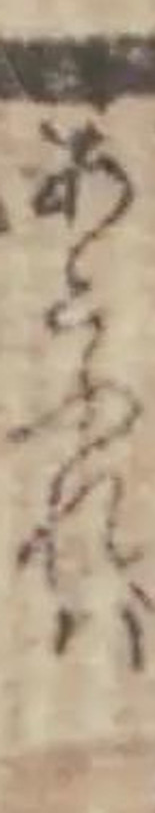あたふれバ
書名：草紙の曙 3巻
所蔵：国立国会図書館 National Diet Library, JAPAN
